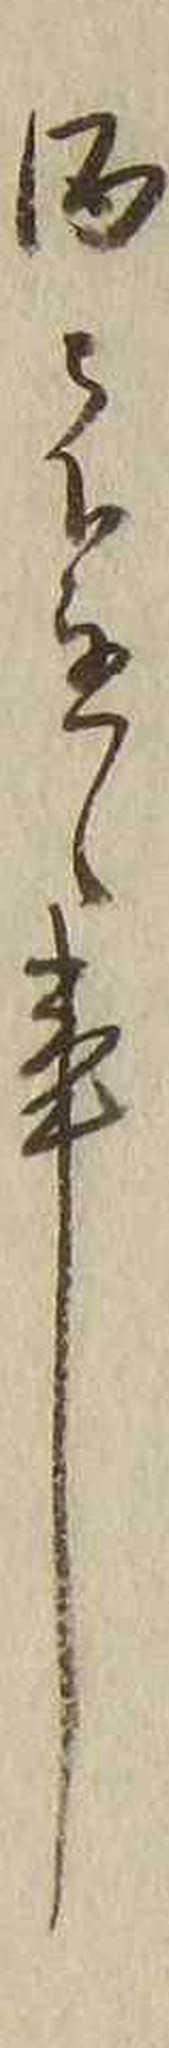酒被下置候事

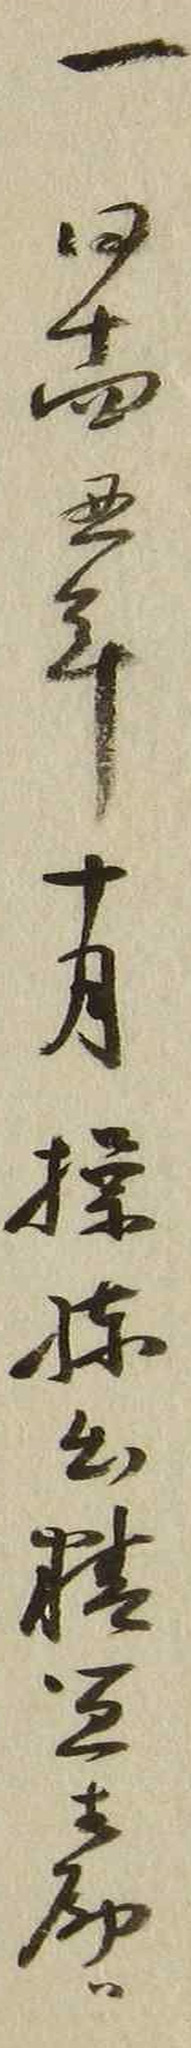一同十四丑年十月操練出精宜相励候
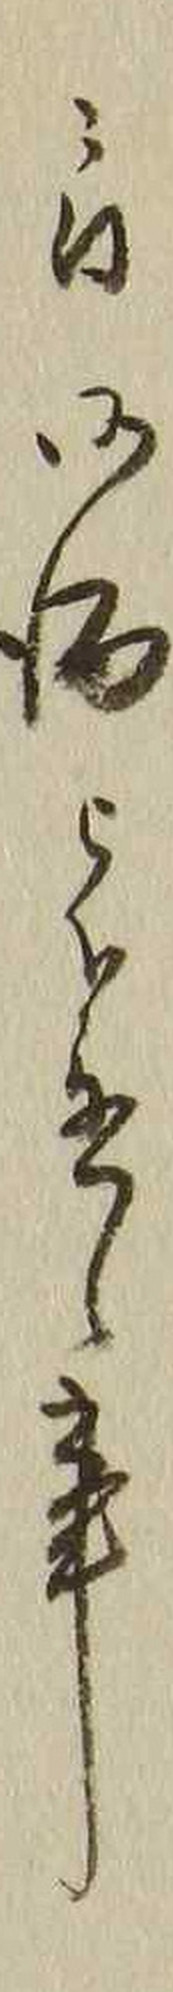ニ付御酒被下置候事
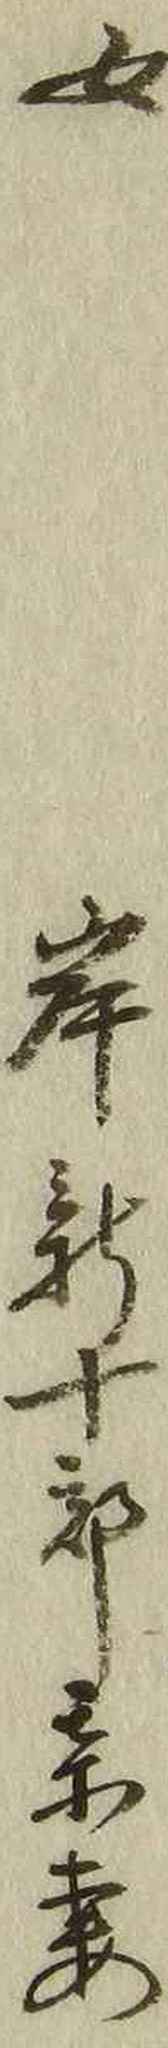女岸新十郎某妻
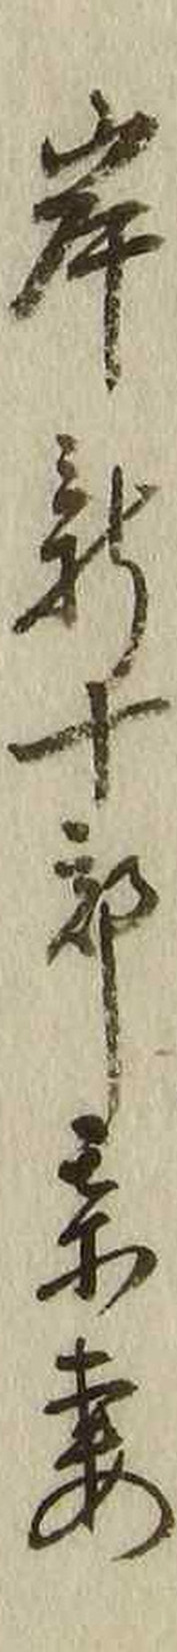女岸新十郎某妻
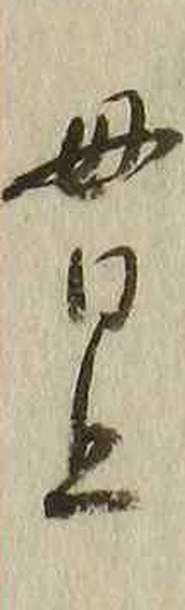母同上
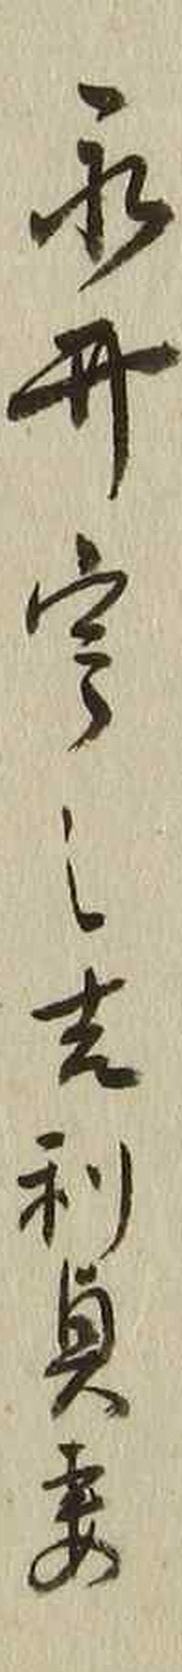女永井宇之吉利貞妻
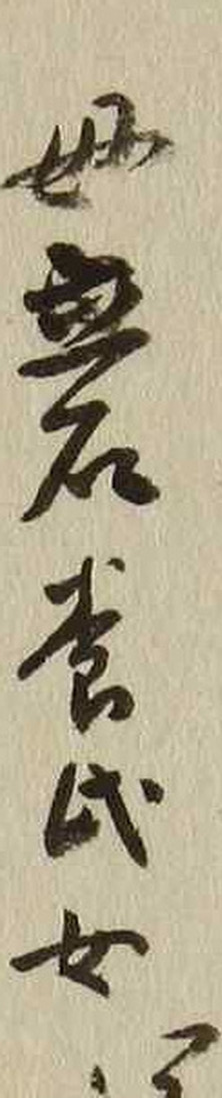母立石養氏女
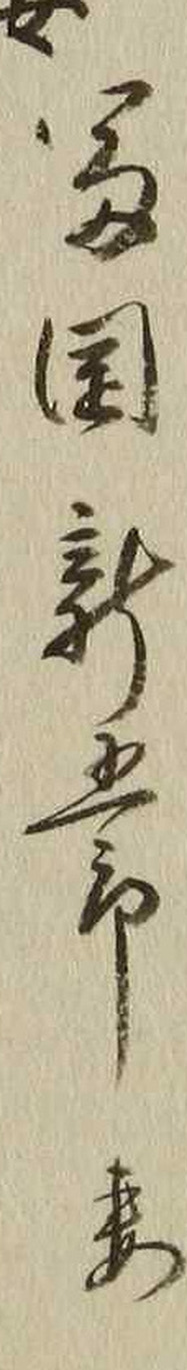富岡新五郎妻

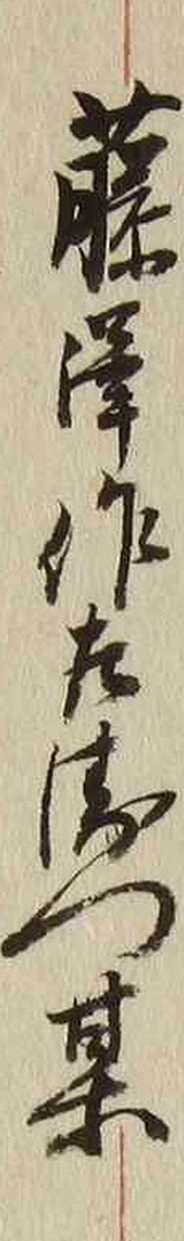藤沢作左衛門某
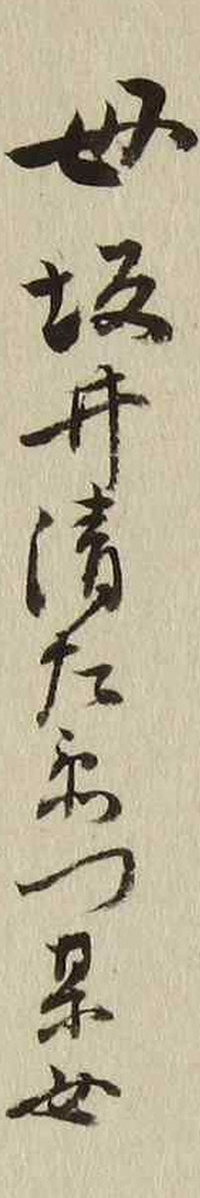母坂井清左衛門某女
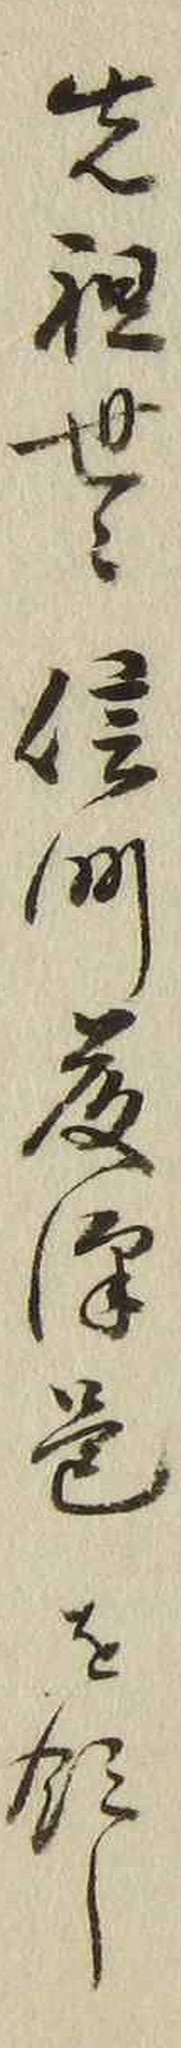先祖世々信州藤沢邑を領し
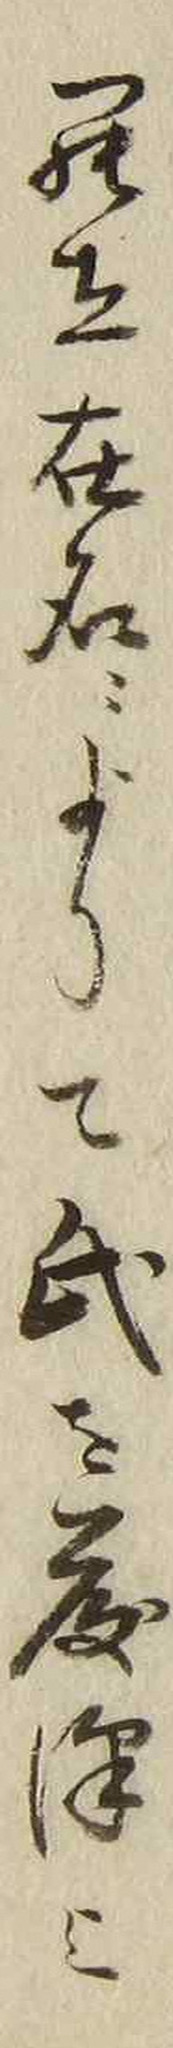罷立在名ニよりて氏を藤沢と

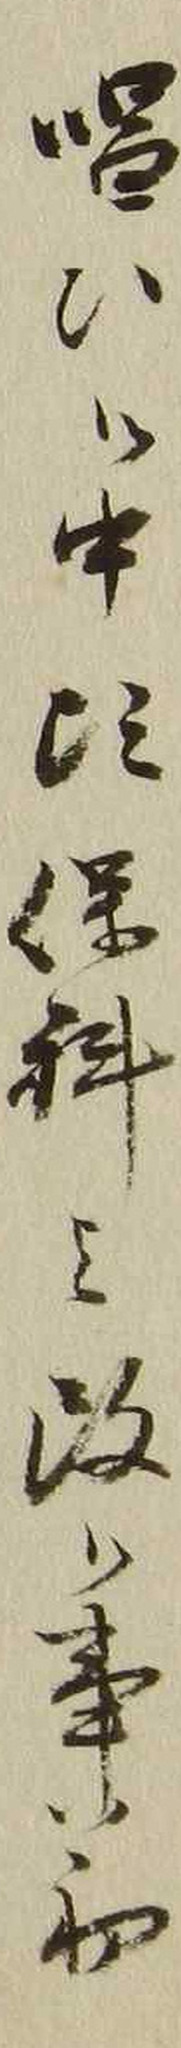唱ひ候中頃保科と改候事ハ初
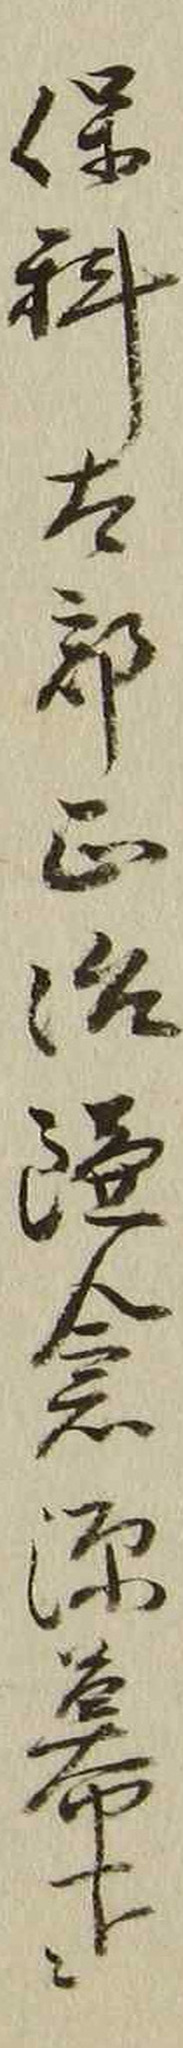保科太郎正治鎌倉源幕下ニ
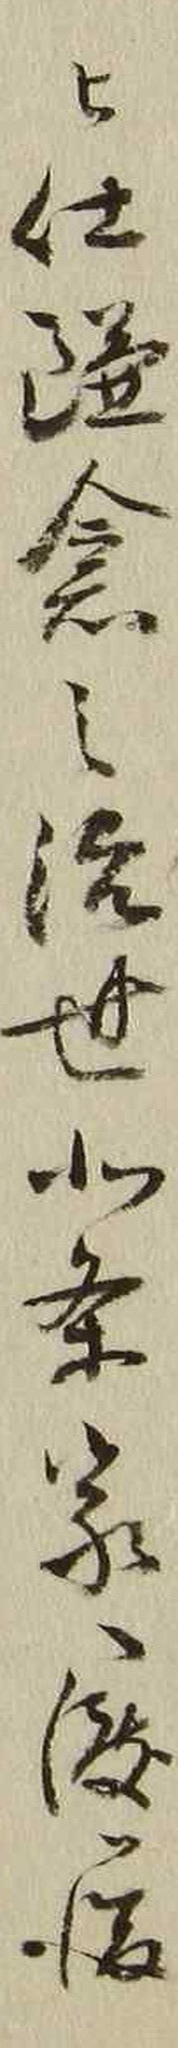被仕鎌倉之治世北条家へ渡候後
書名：諸士系譜　巻之236　ふ之部4
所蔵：会津若松市立会津図書館
